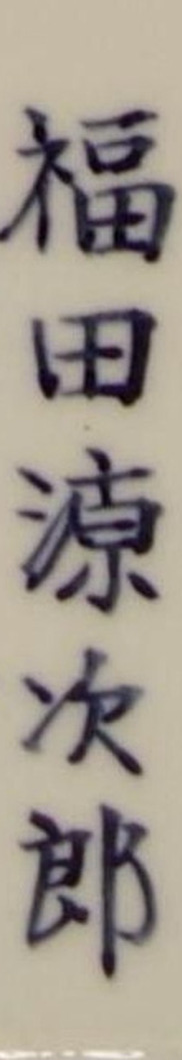福田源次郎
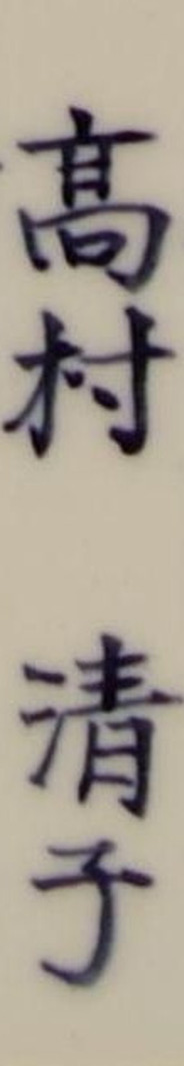高村清子
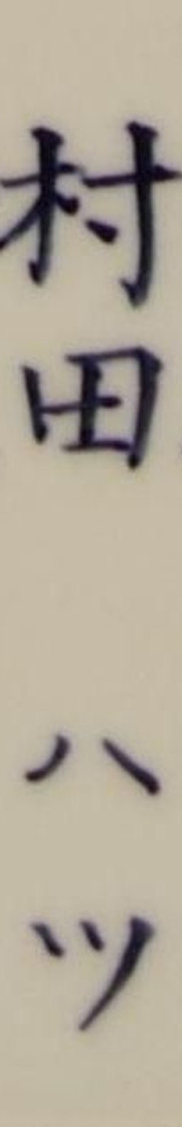村田ハツ
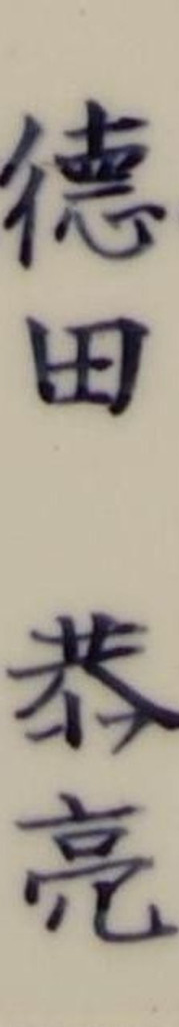徳田恭亮
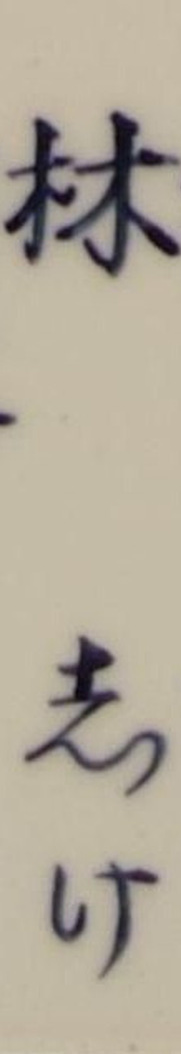林しけ
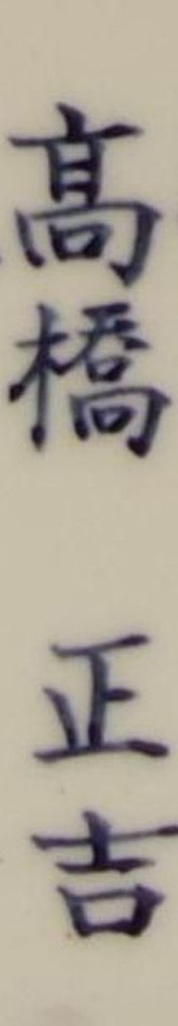高橋正吉
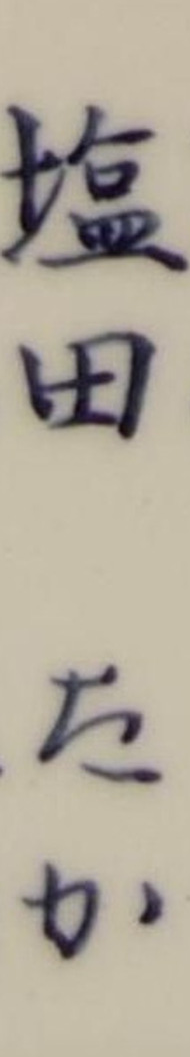塩田左か
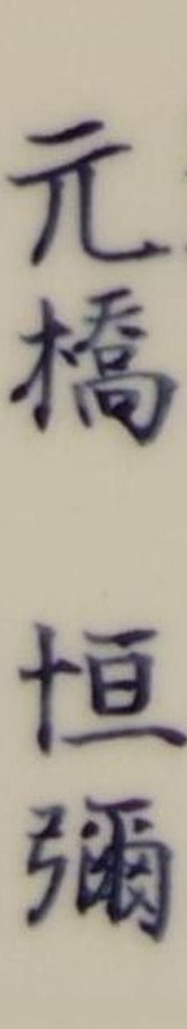元橋恒彌
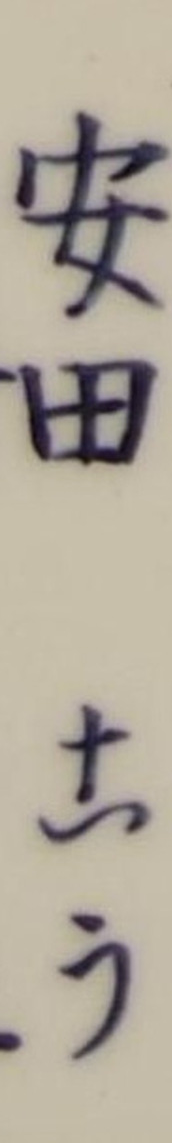安田こう
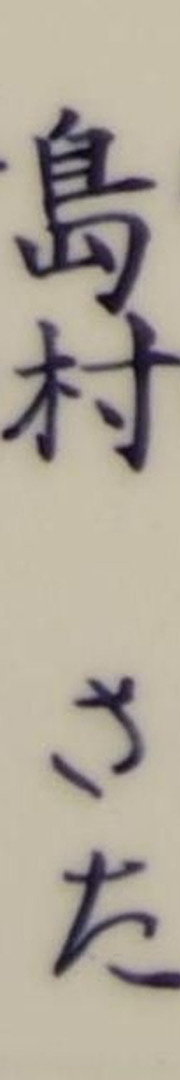島村さた
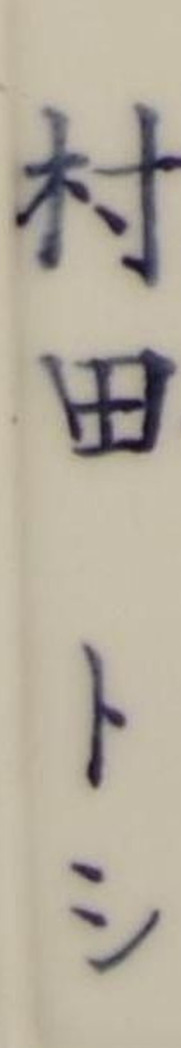村田トシ

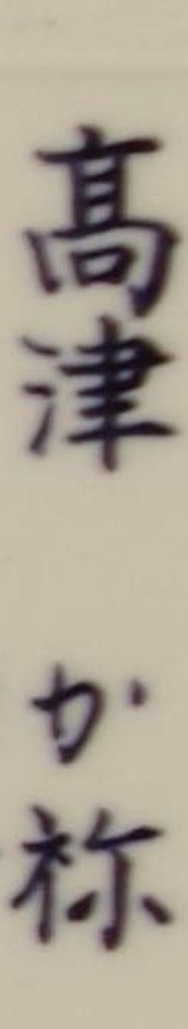高津かね
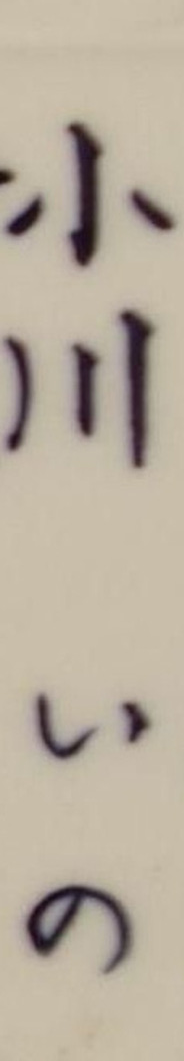小川いの
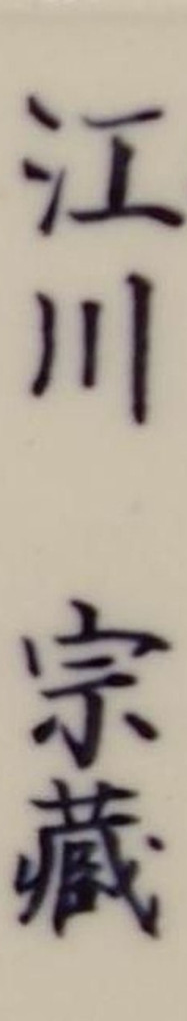江川宗蔵
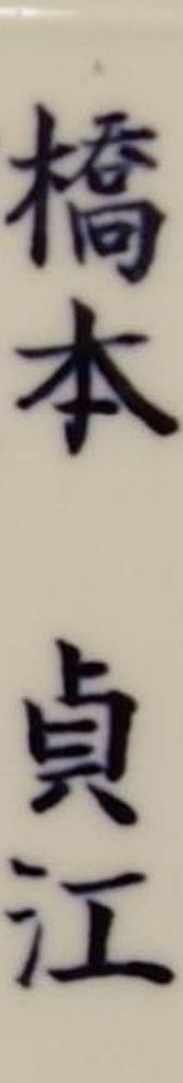橋本貞江
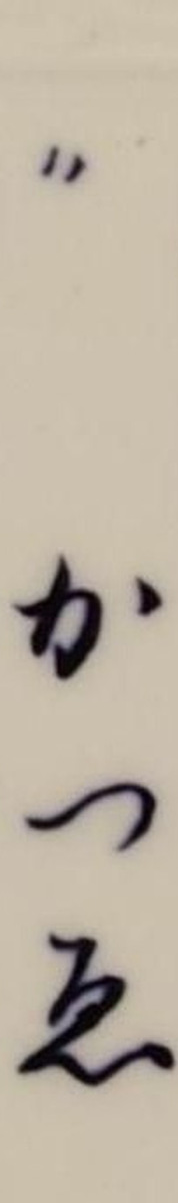かつえ
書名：E~L
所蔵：高野山金剛峯寺
